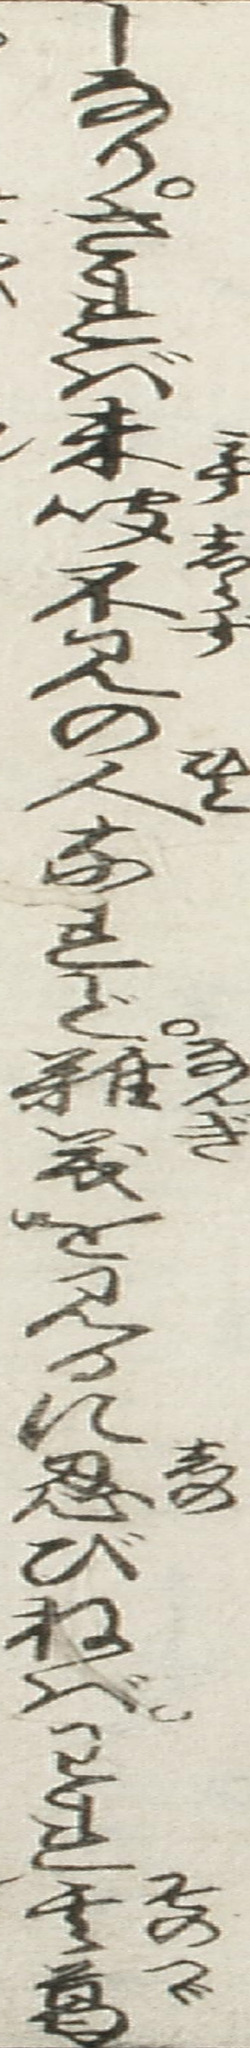しなり。されば未聞不見の人なれど。難義を見るに忍びねば。われ其葛
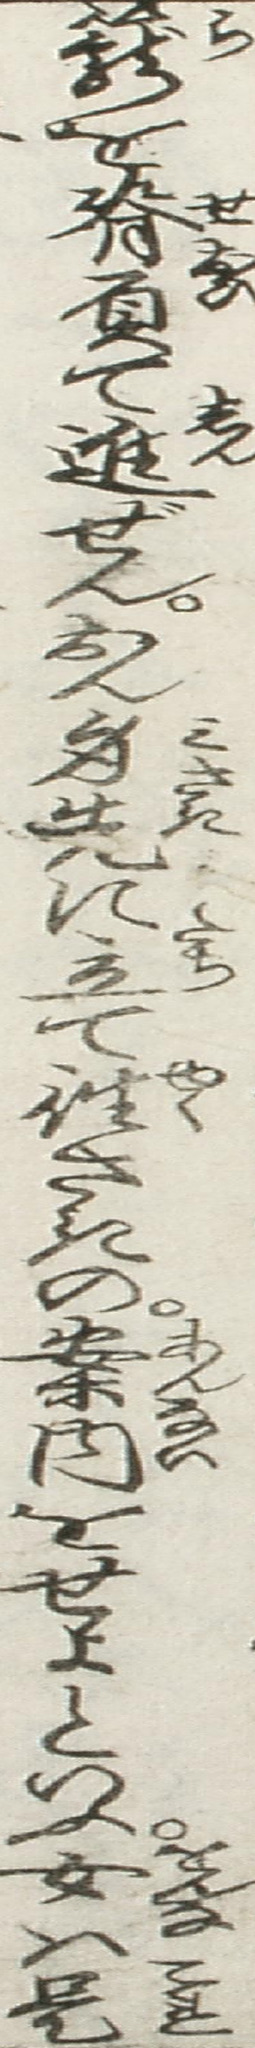籠を背負て進ぜん。おん身先に立て往さきの。案内をせよといふ。女は是
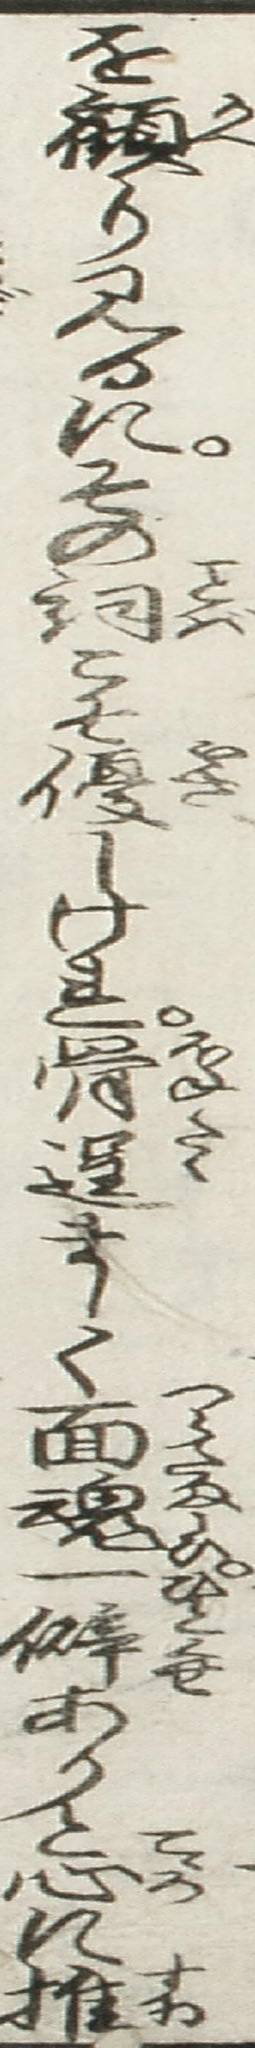を顧り見るに。その詞こそ優しけれ。骨逞ましく面魂。一癖ありと心に推
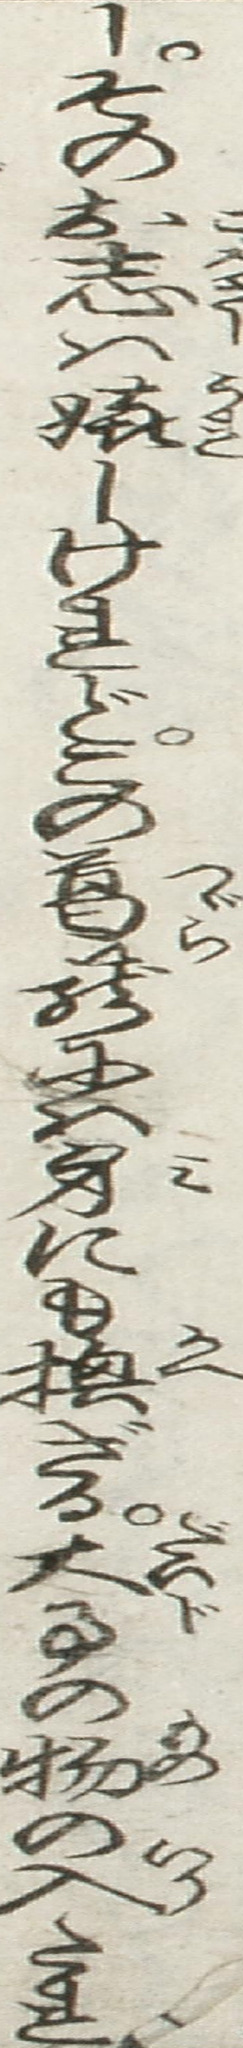し。そのお志は嬉しけれど。この葛籠には身にも換ざる。大事の物の入たれ
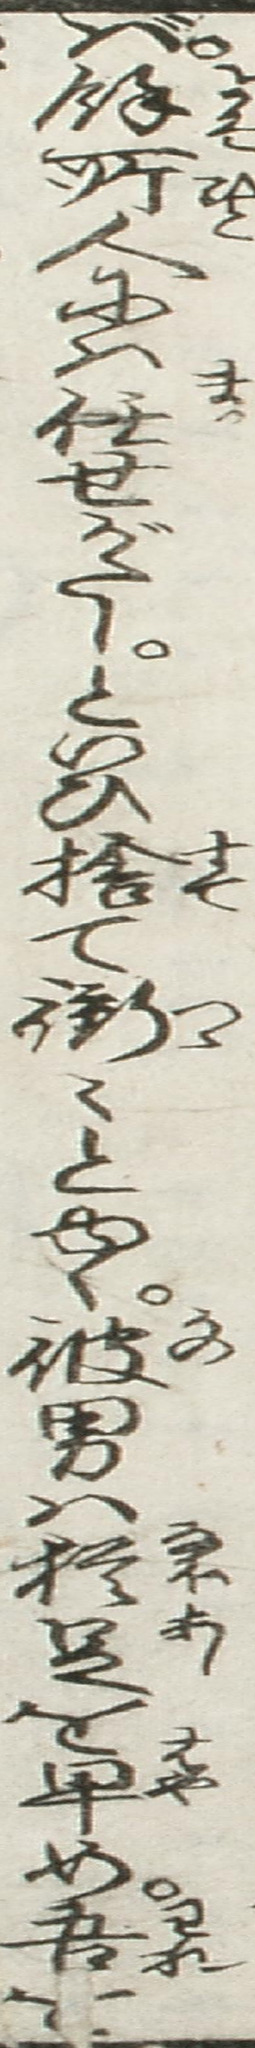ば。餘所人には任せがたし。といひ捨て衝々とゆく。彼男は猶足を早め。吾を
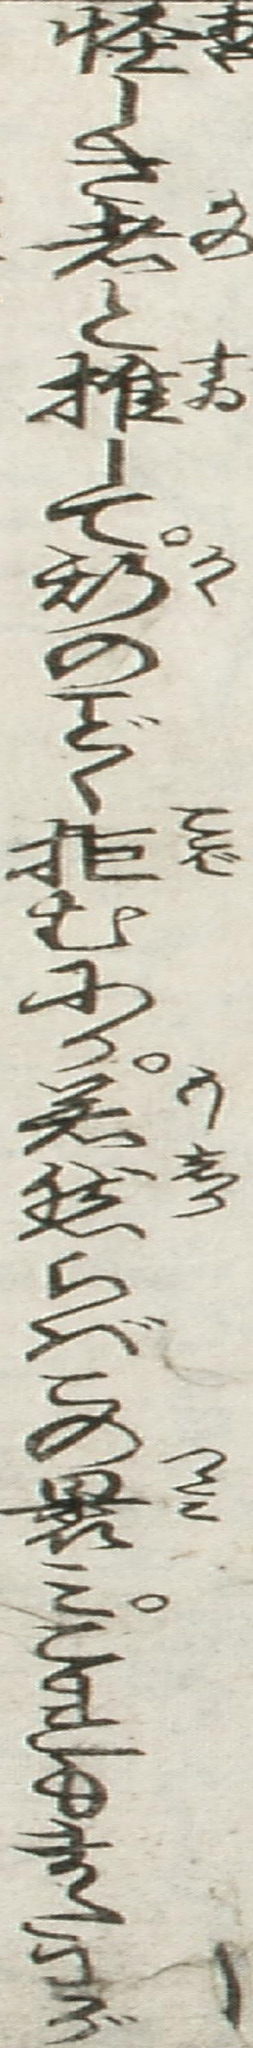怪しき者と推して。斯のごとく拒むにか。若然らばこの裹み。これもまたわが
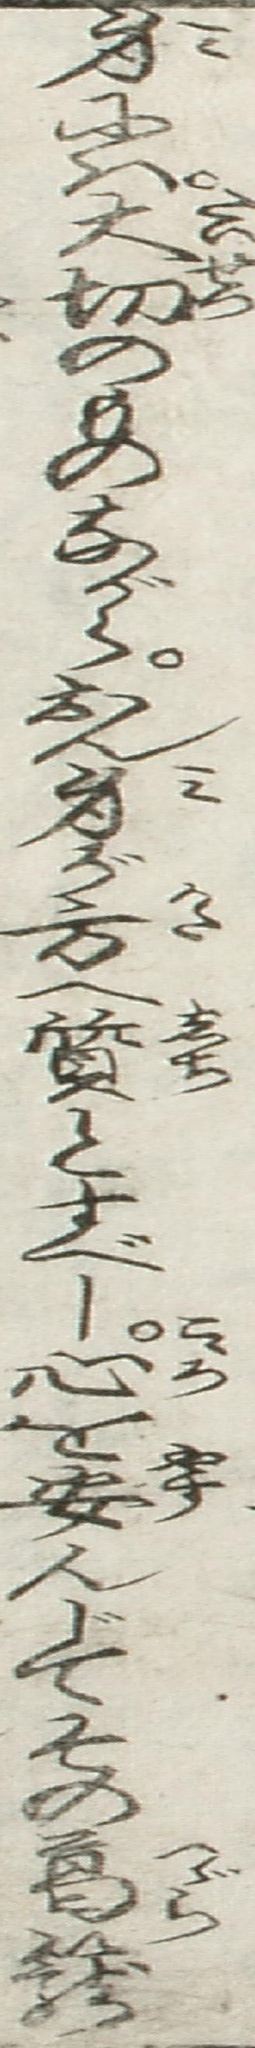身には。大切のものながら。おん身が方へ質とすべし。心を安んじてその葛籠
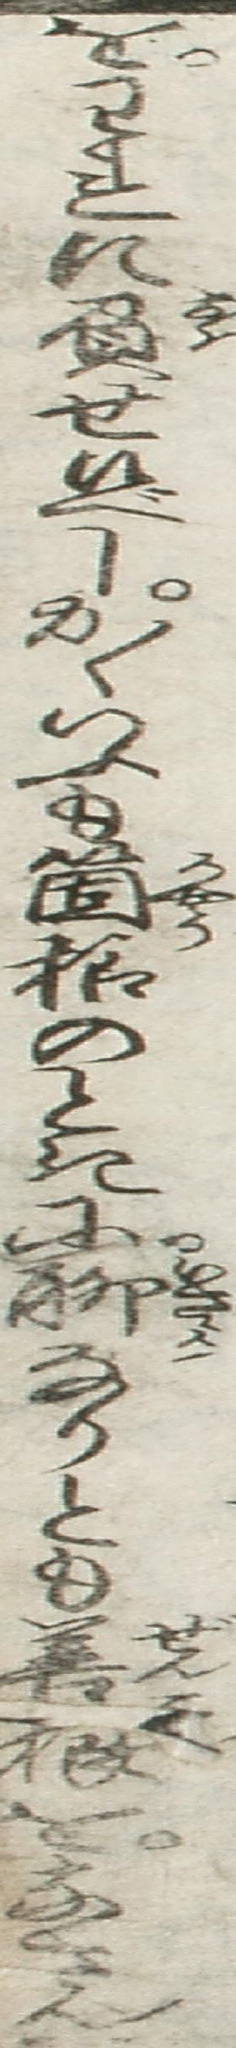を。われに負せ候べし。かくいふも箇様のときに。聊なりとも善根を。なさん

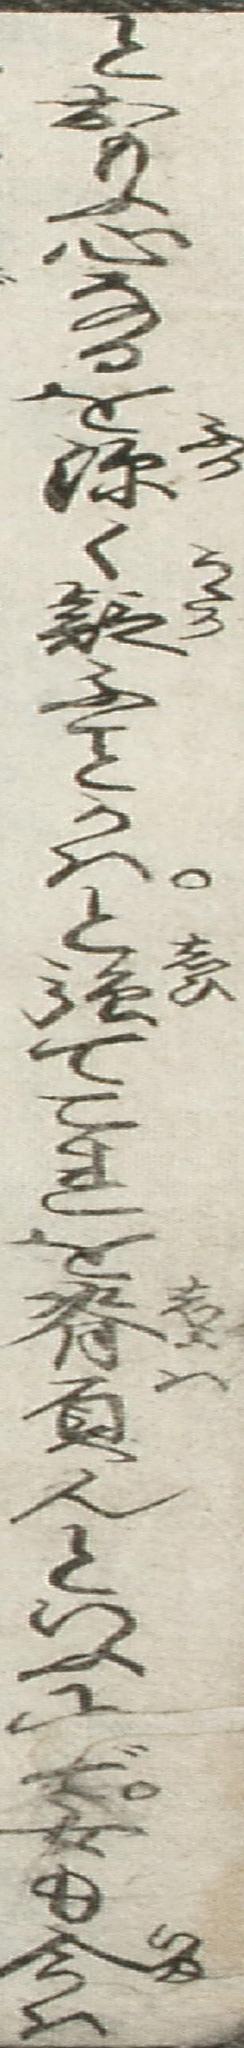とおもふ心なるを深く疑ふことかは。と強てこれを背負んといふにぞ。女も今は
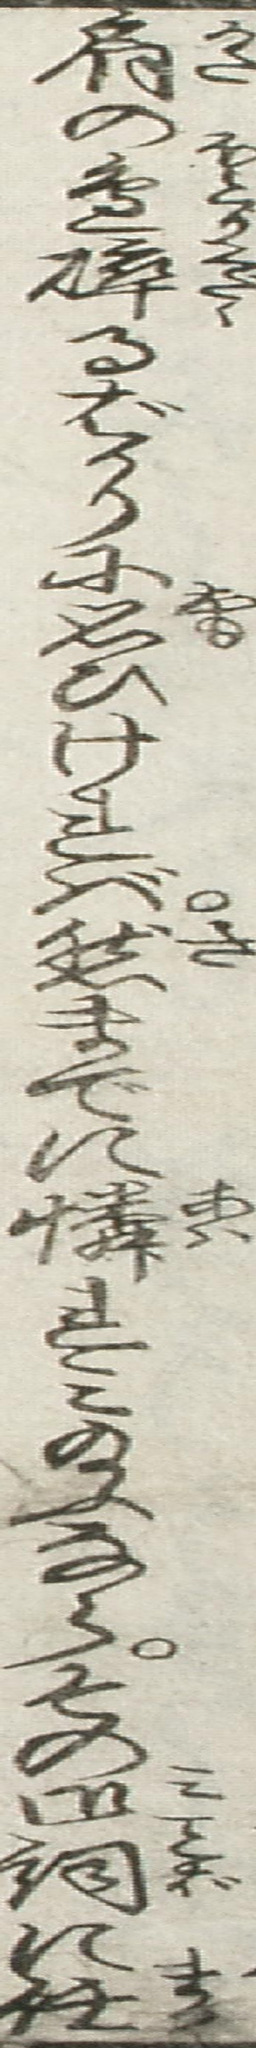肩の辺砕るばかりに思ひければ。然までに憐れみ給ふなら。その御詞に任
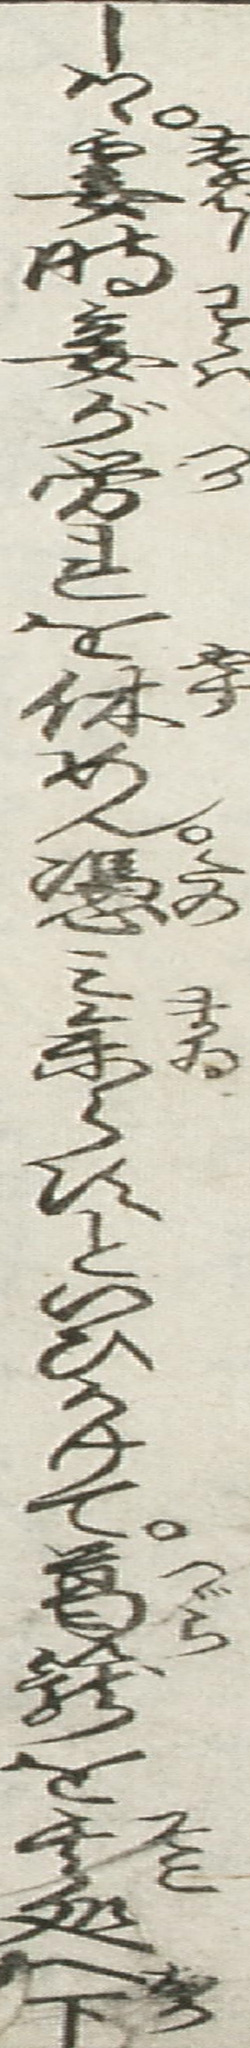しツゝ。霎時妾が労れを休めん。憑み参らすといひかけて。葛籠を其処へ下
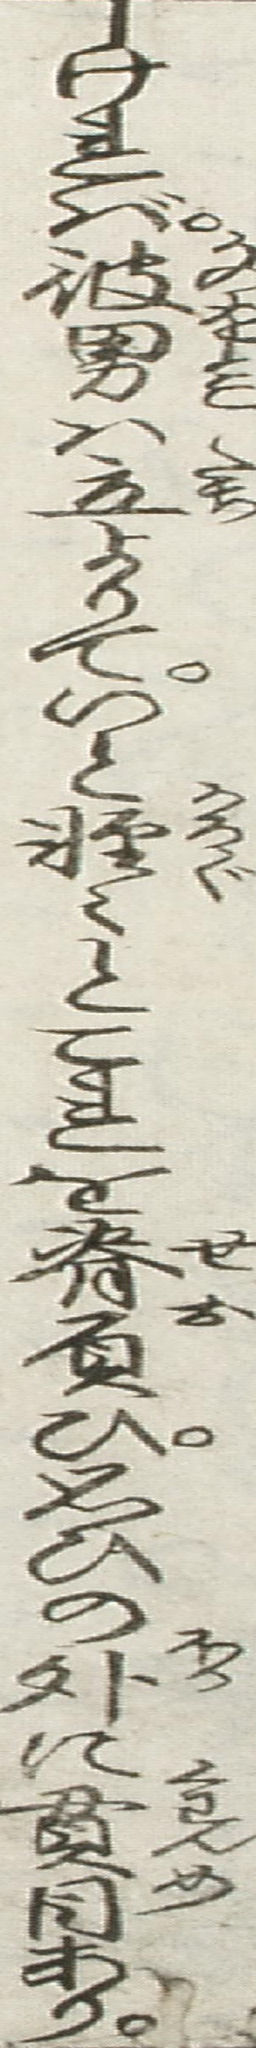しければ。彼男は立よりて。いと軽々とこれを背負ひ。思ひの外に貫目あり。
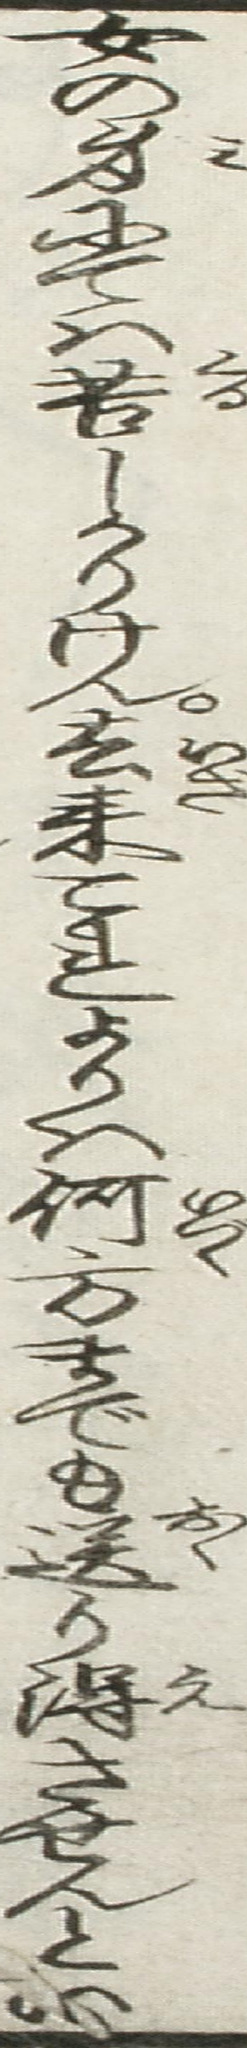女の身にては苦しかりけん。去来これよりは何方までも送り得させんとい
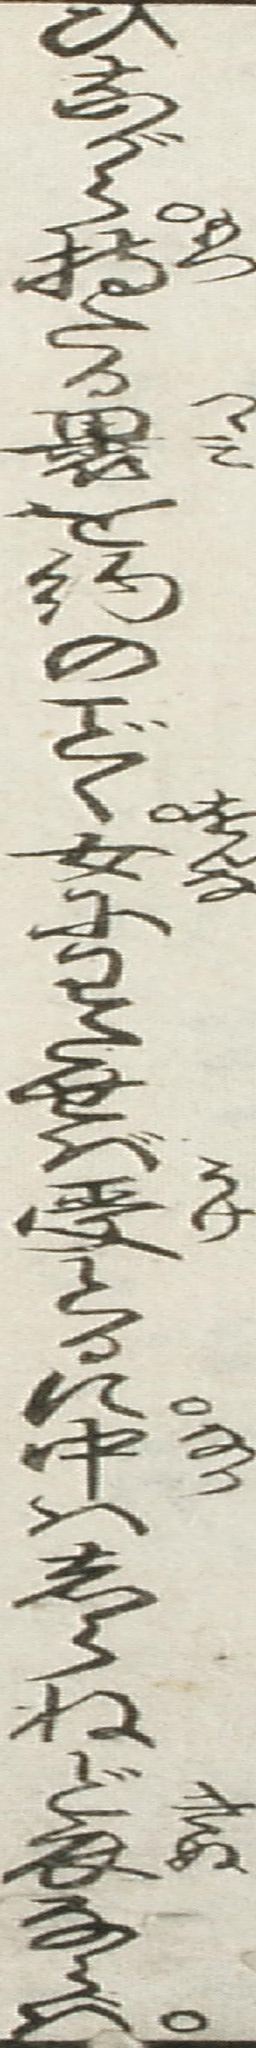ひながら。持たる裹を約のごとく。女にわたせば受とるに。中はしらねど衣ならば。
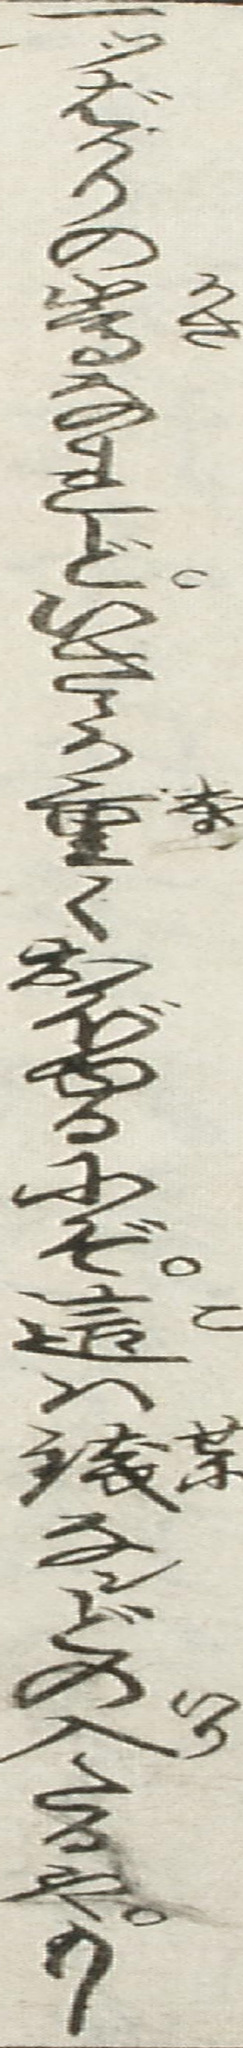一ッばかりの嵩なれど。いさゝか重くおぼゆるにぞ。這は銭なンどの入たるや。もし
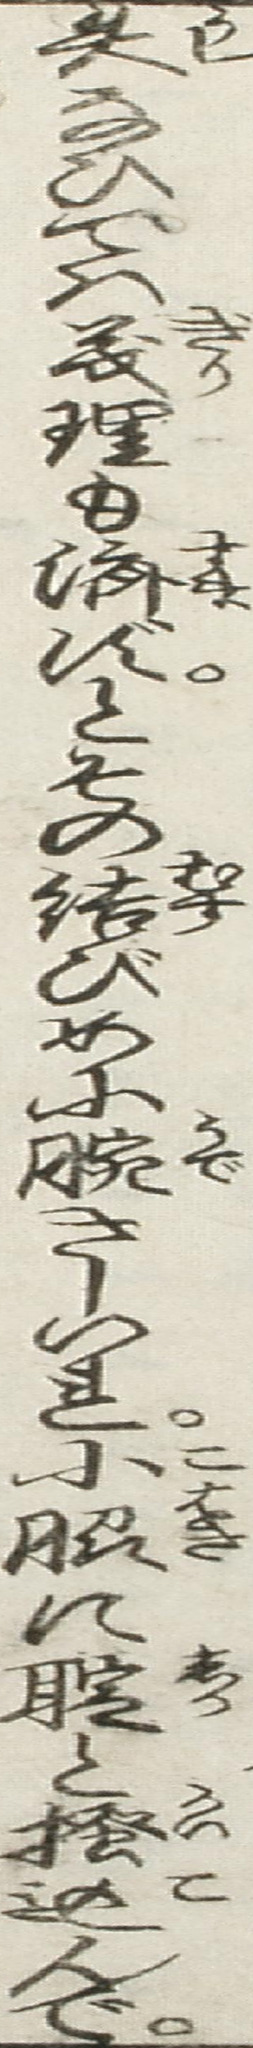失なひては義理も済ず。とその結びめに腕さしいれ。小脇に聢と掻込んで。
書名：安政見聞録　下
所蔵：東京大学地震研究所図書室 Earthquake Research Institute Library, The University of Tokyo, JAPAN
